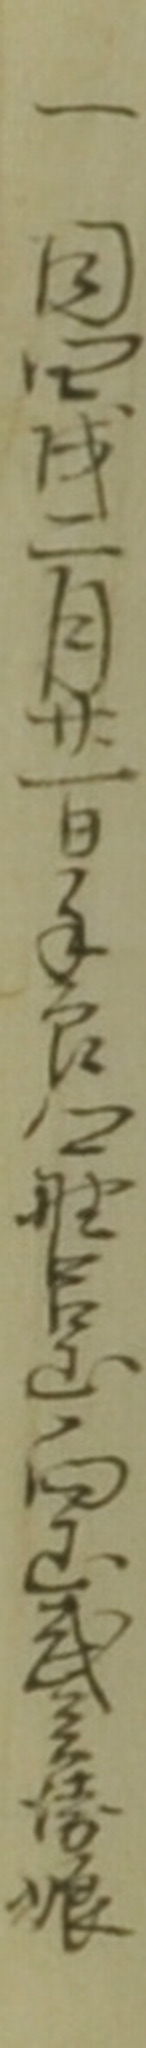一同四戌二月廿一日手良郷野呂山向山武兵衛娘

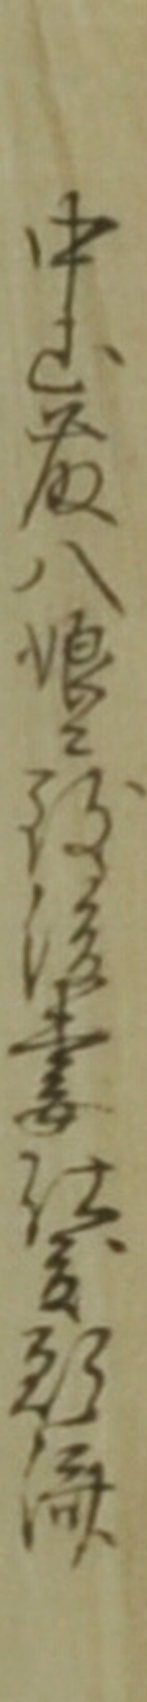中山藤八娘ニ致後妻仕度願済
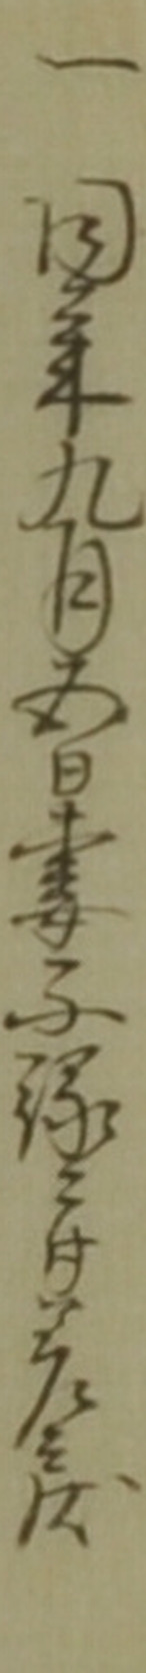一同年九月五日妻不縁ニ付差戻
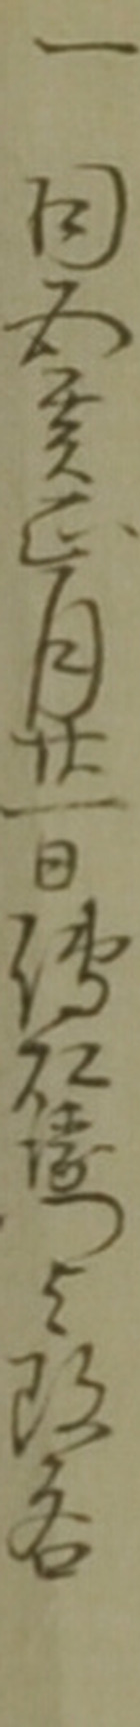一同五亥正月廿一日伝左衛門与改名
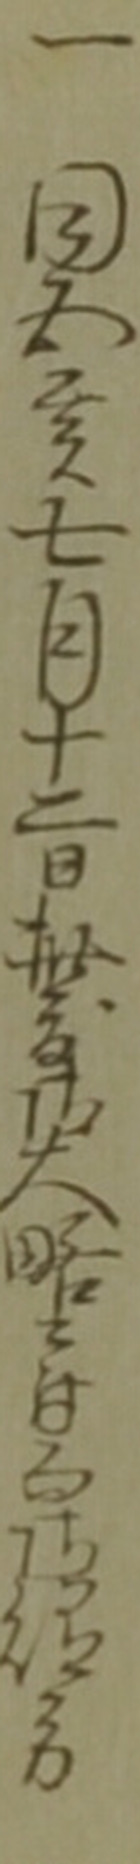一同五亥七月十二日此度御大略ニ付而御賄方
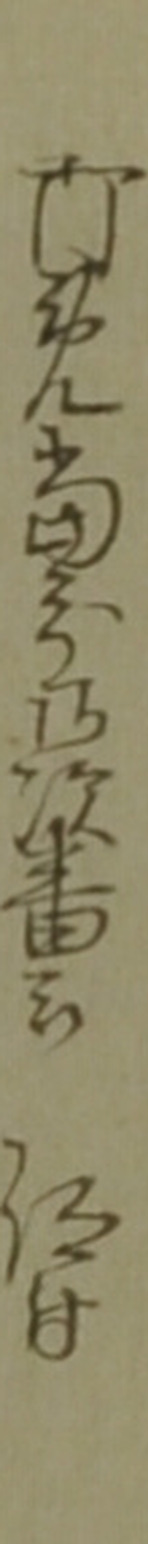御免当分御次番被仰付
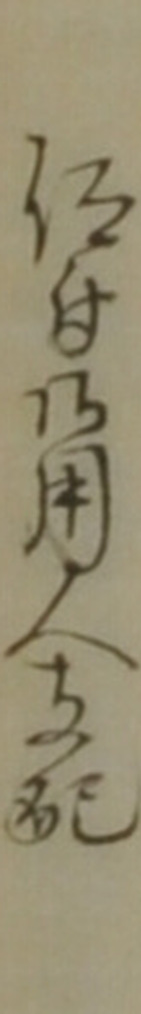仰付御用人支配
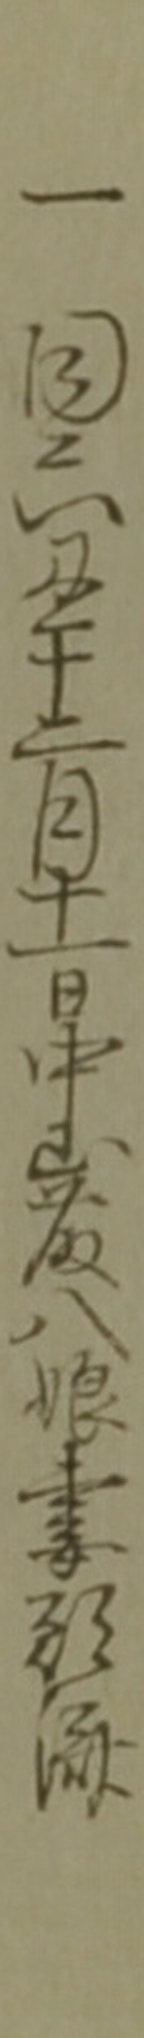一同六丑十二月十一日中山藤八娘妻願済
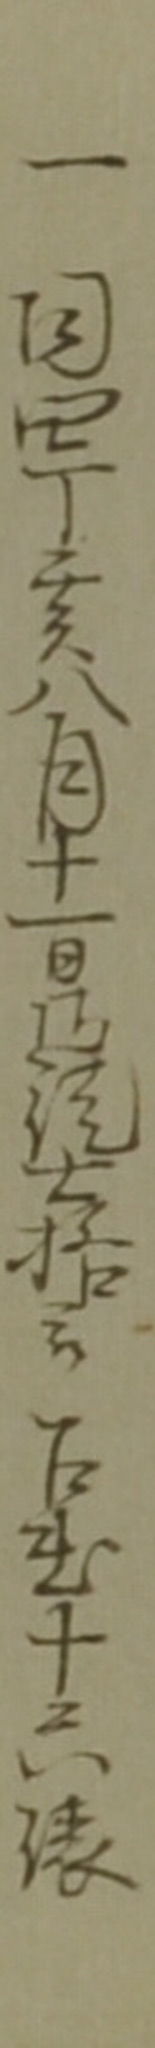一同四丁亥八月十一月御徒士格被召出十六俵
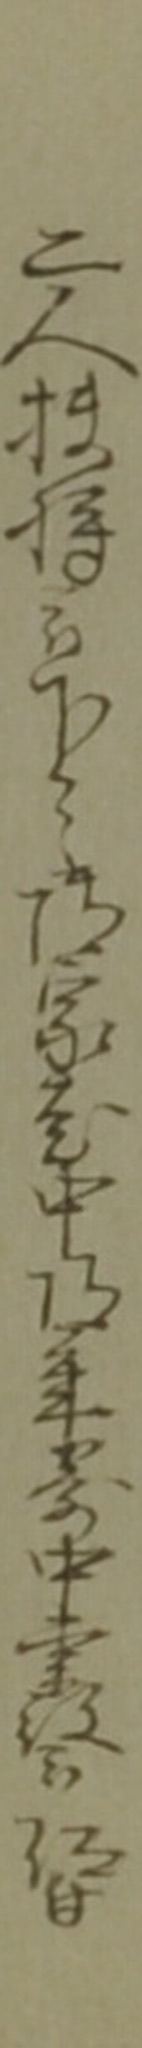二人扶持被下之御家老中御年寄中書役被仰付
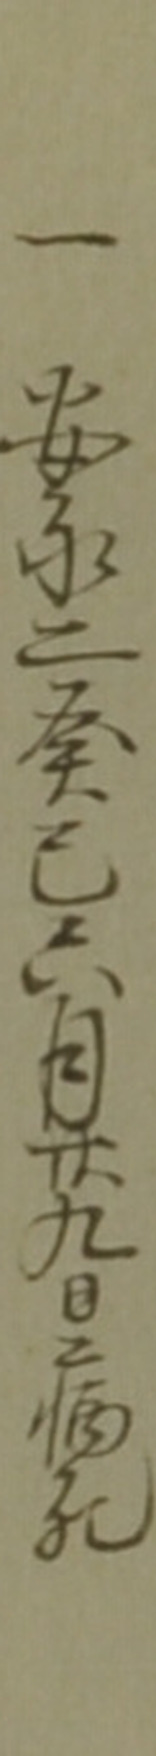一安永二癸巳六月廿九日病死
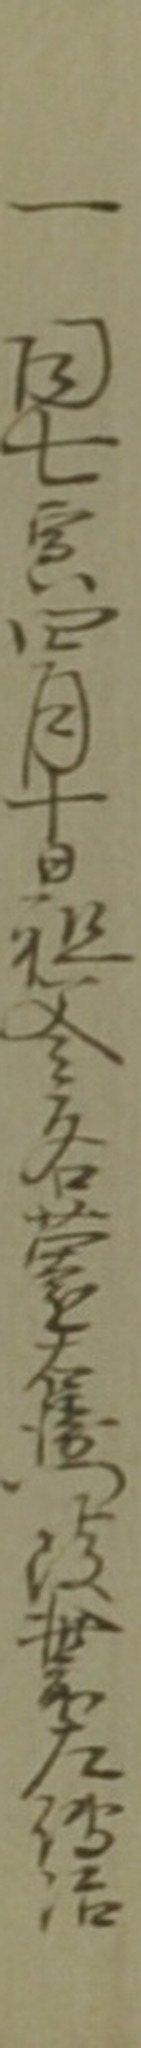一同七寅四月十日祖父之名薗右衛門ト改此前左伝治

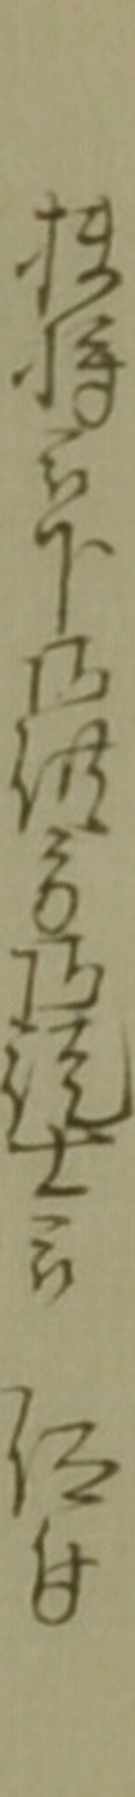扶持被下御供方御徒士被仰付
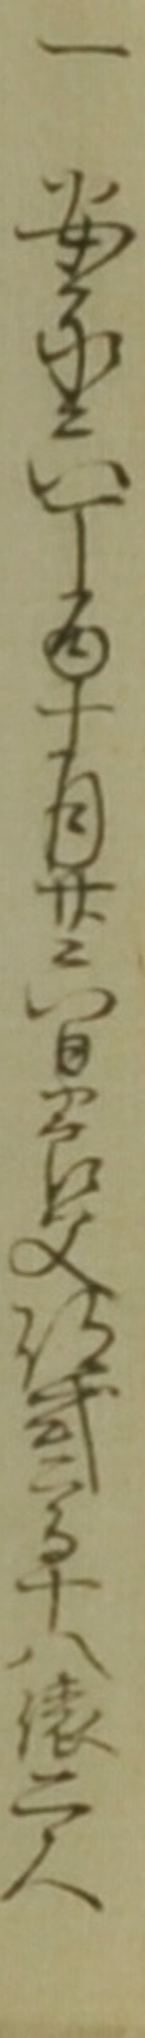一安永六丁酉十月廿六日養父跡式高十八俵二人
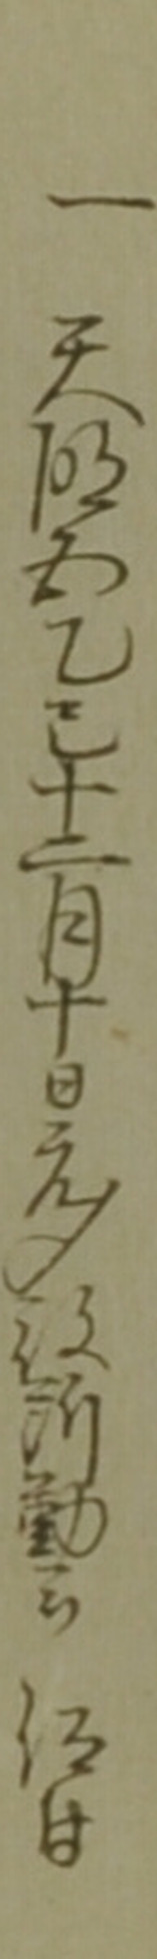一天明五乙巳十二月十日元〆役所勤被仰付
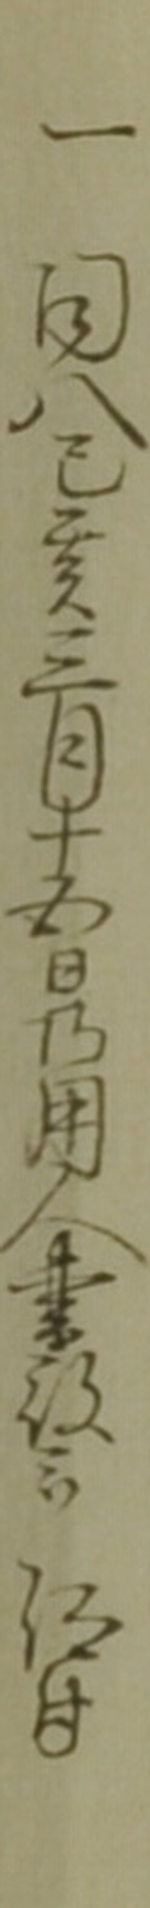一同八己亥三月十五日御用人書役被仰付
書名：無足廃家（壱）
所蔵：伊那市立高遠町図書館・合同会社AMANE
